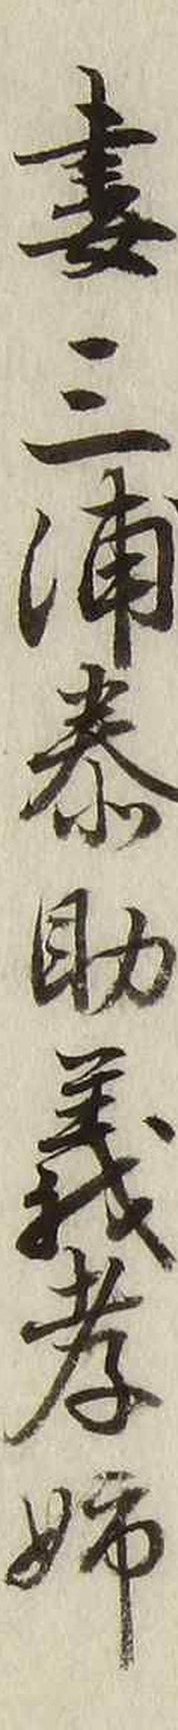妻三浦泰助義孝姉

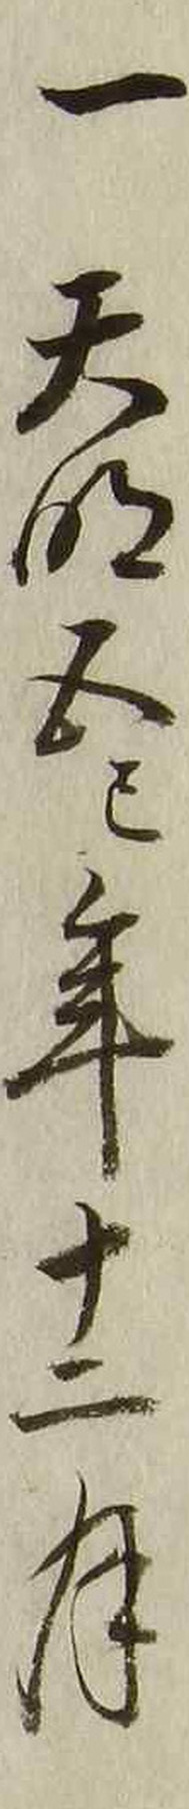一天明五巳年十二月
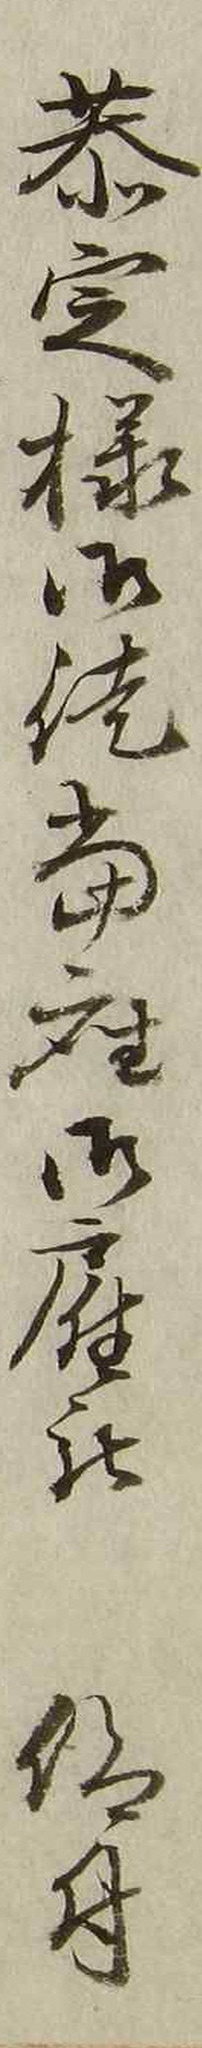恭定様御徒当座御雇被仰付
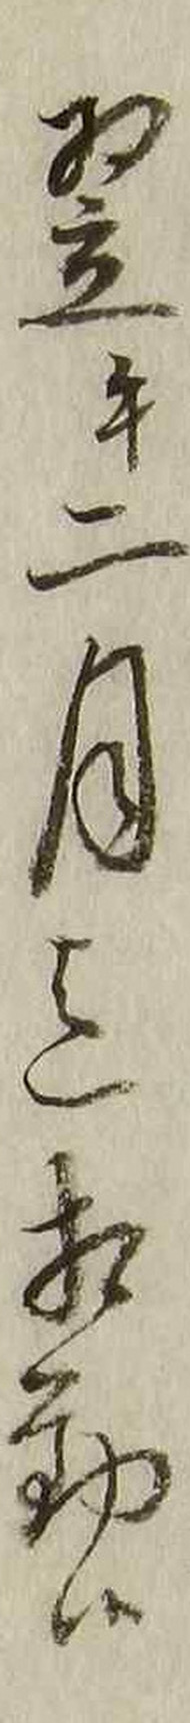翌午二月迄相勤候
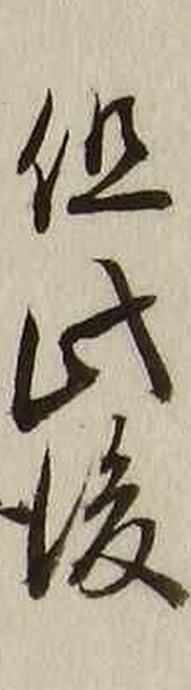但此後
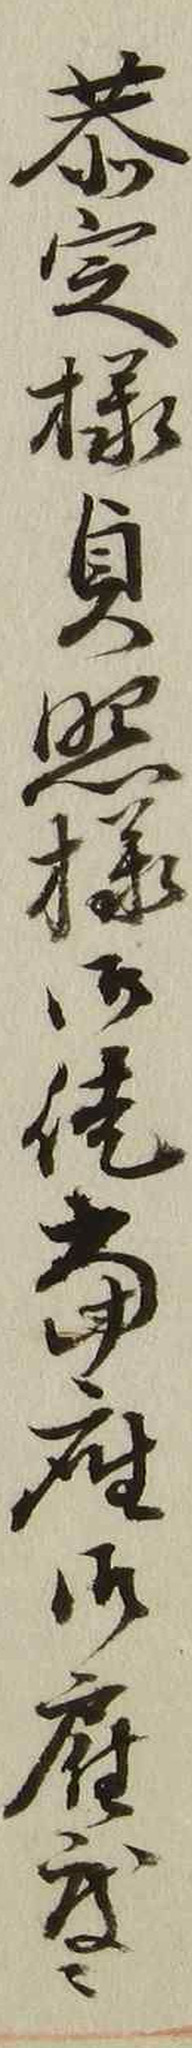恭定様貞照様御徒当座御雇度々
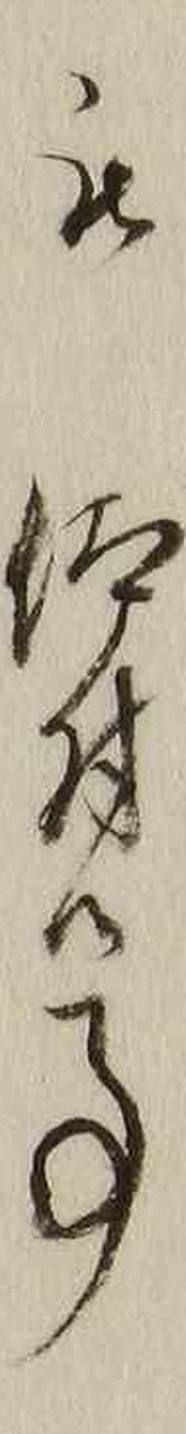被仰付候事
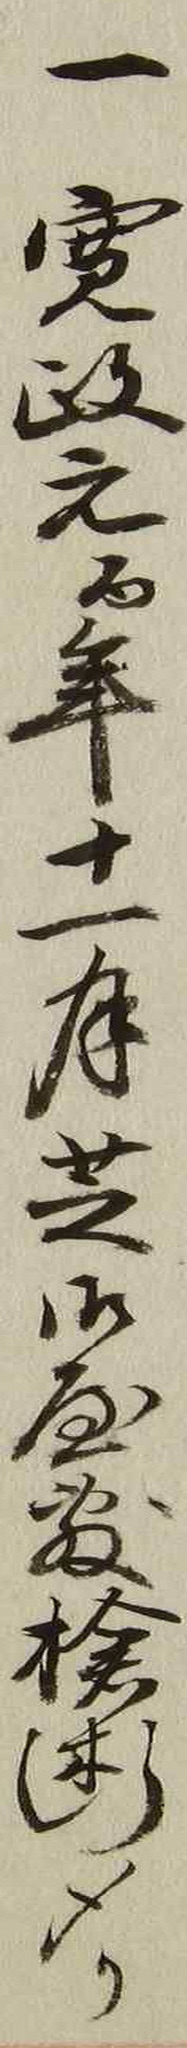一寛政元酉年十一月芝御屋敷槍術〆り
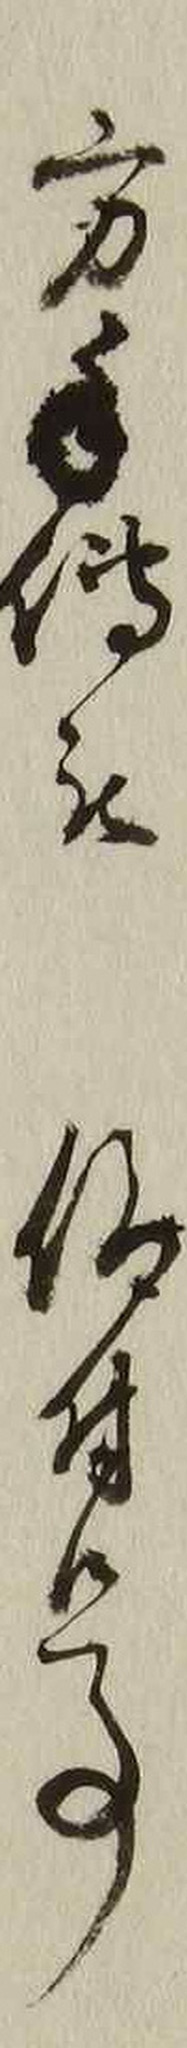方手伝被仰付候事
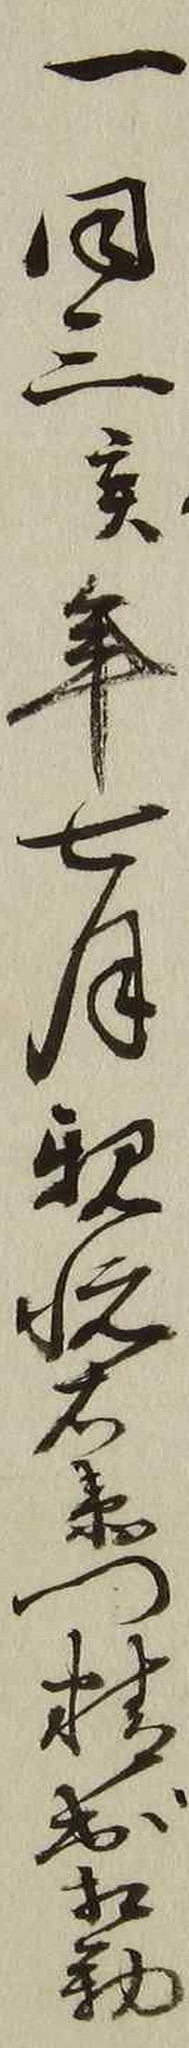一同三亥年七月親悦右衛門精出相勤
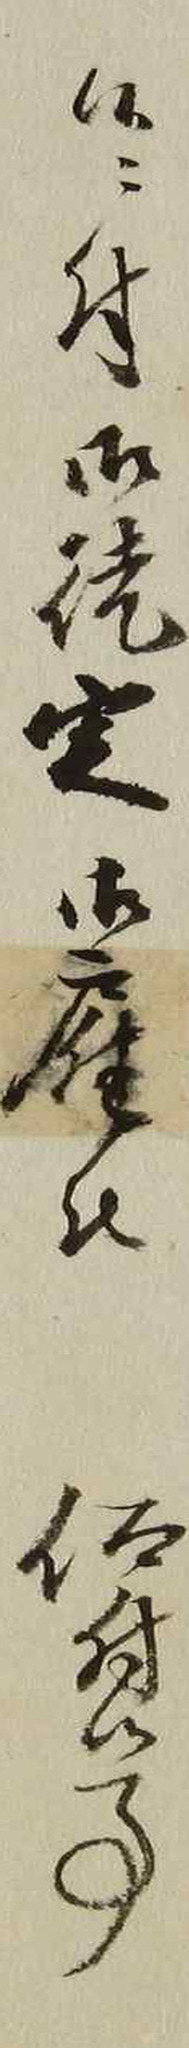候ニ付御徒定御雇被仰付候事
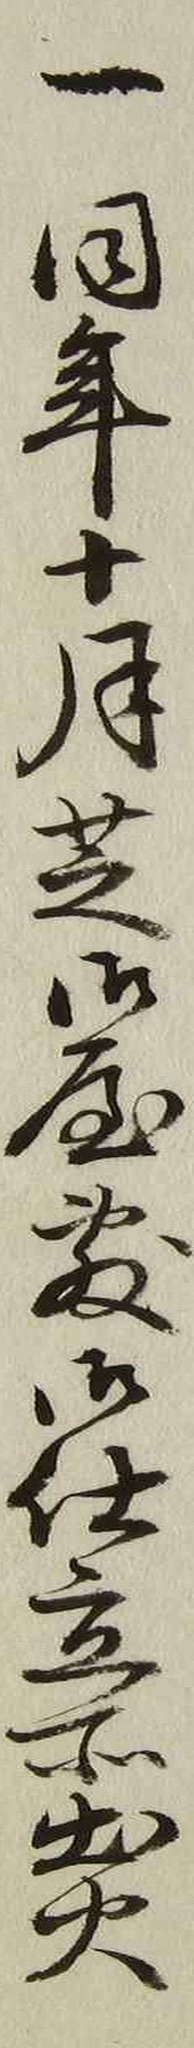一同年十月芝御屋敷御仕立所出火
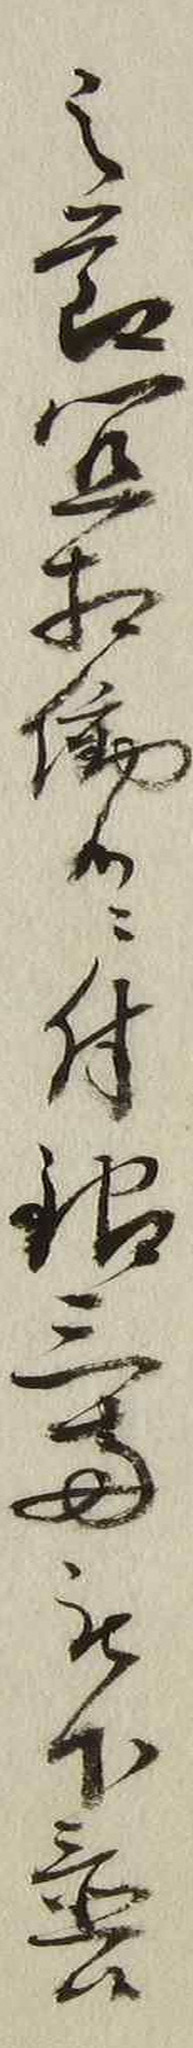之節宜相働候ニ付銀三両被下置候
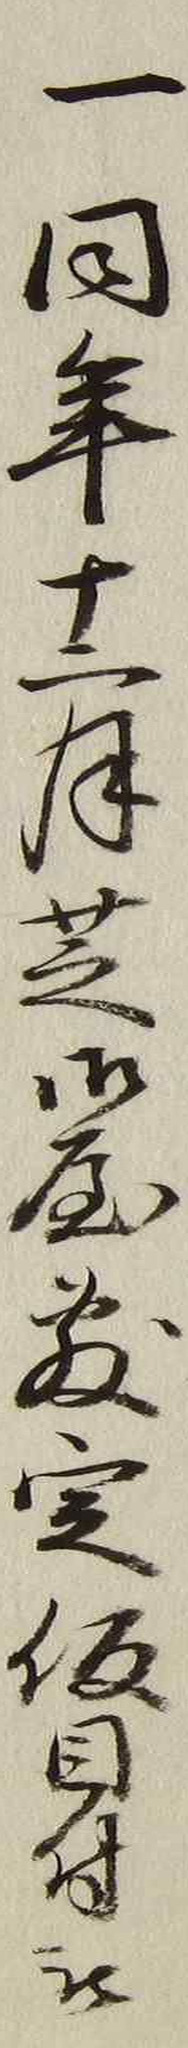一同年十二月芝御屋敷定仮目付被
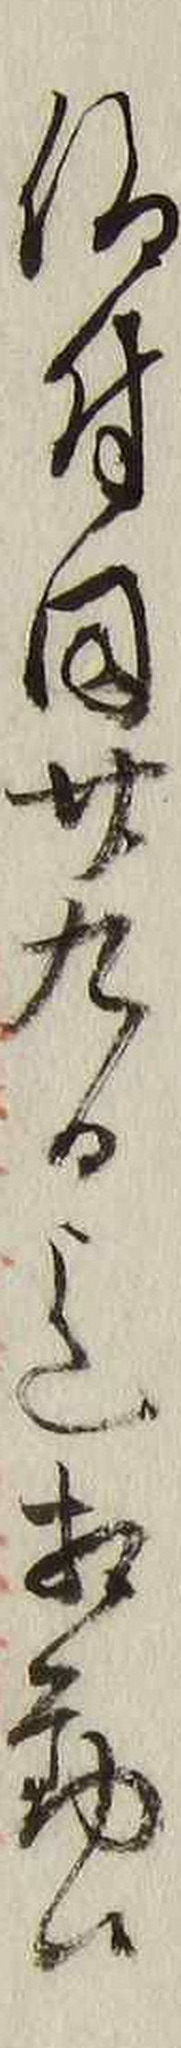仰付同廿九日迄相動候
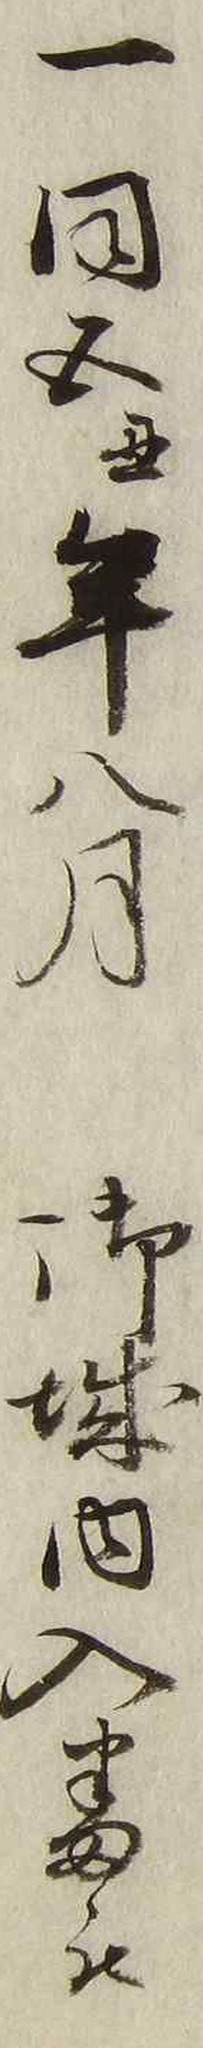一同五丑年八月御城内入番被
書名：諸士系譜　巻之39　は之部7
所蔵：会津若松市立会津図書館
